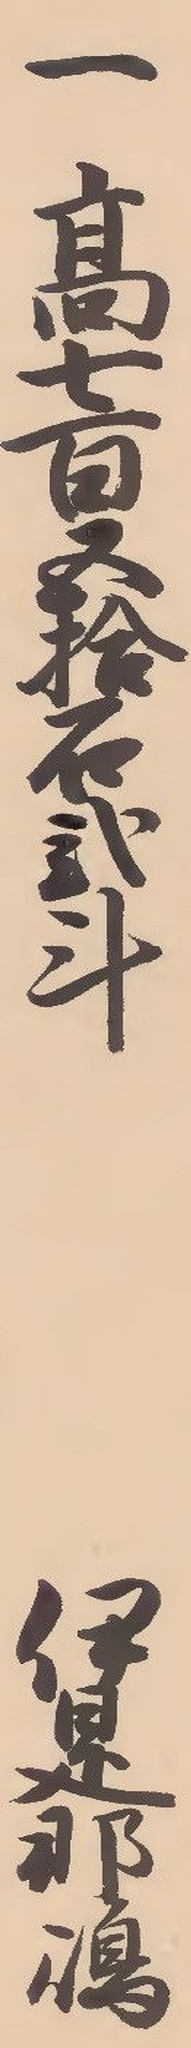一高七百五拾石弐斗伊是那嶋
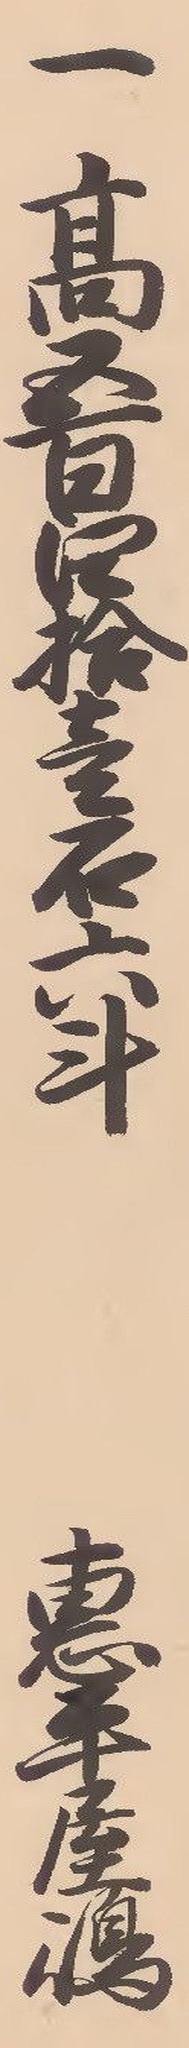一高五百四拾壱石六斗恵平屋嶋
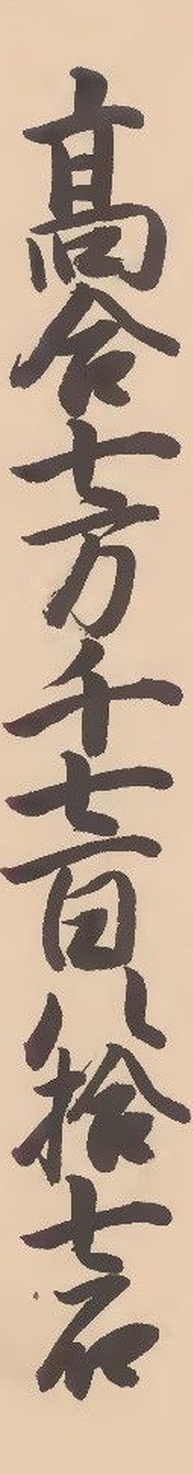高合七万千七百八拾七石
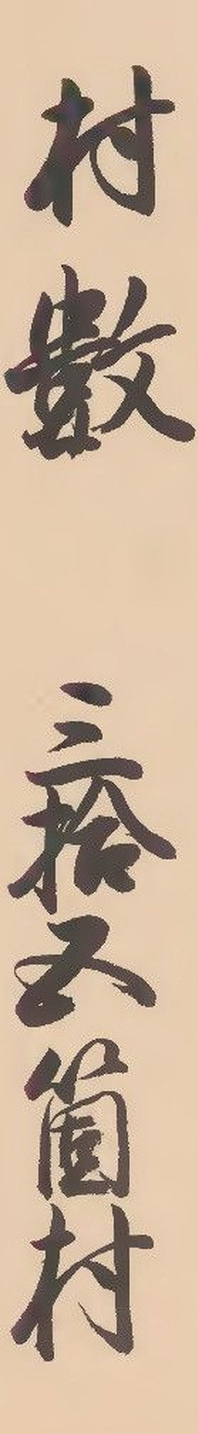村数三拾五箇村
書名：琉球国郷帳　上
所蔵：国立公文書館 National Archives of Japan
